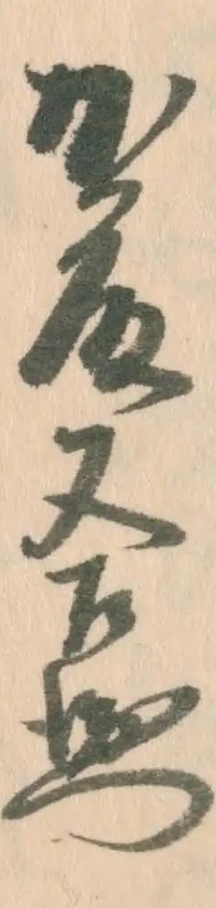辰加藤又左衛門
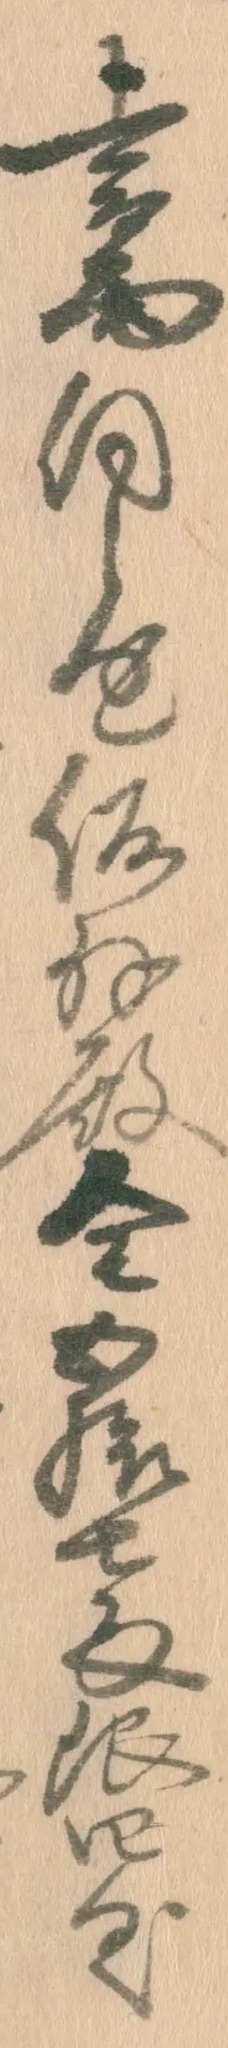│書面伺之通仮拝殿金五拾七両銀四匁
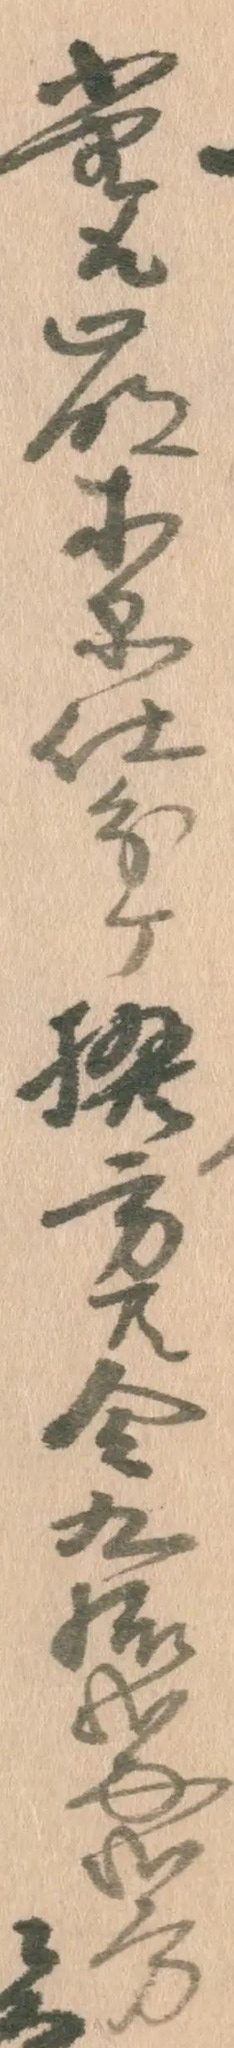│堂取崩木品仕分け撰方共金九拾弐両弐分に而
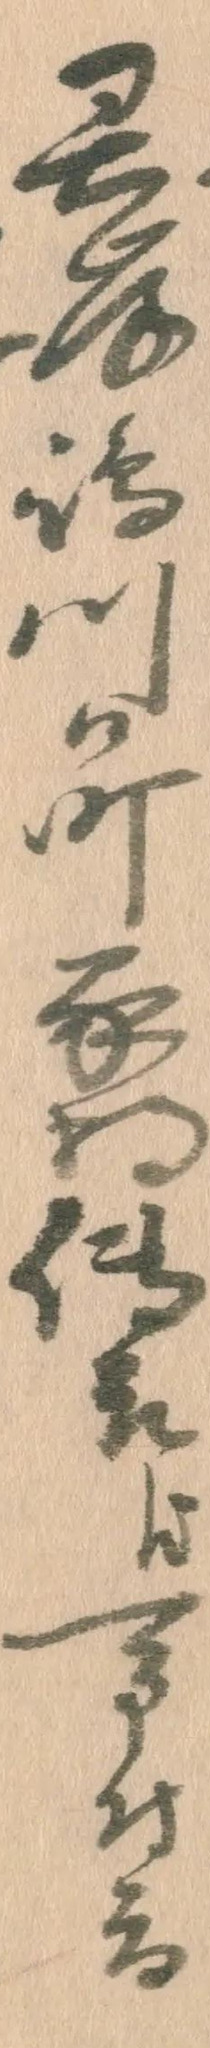│霊岸嶋川口町家持伝吉え可申付旨
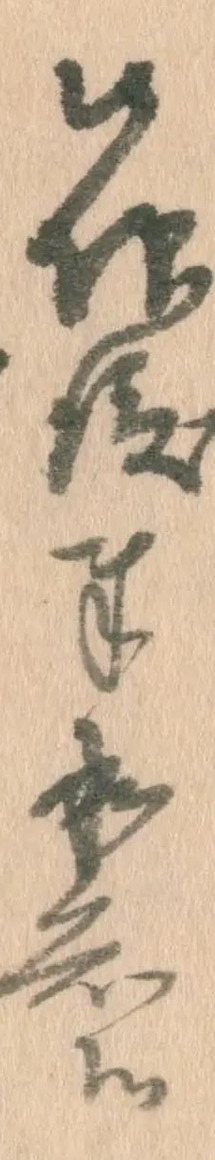│被仰渡奉承知候

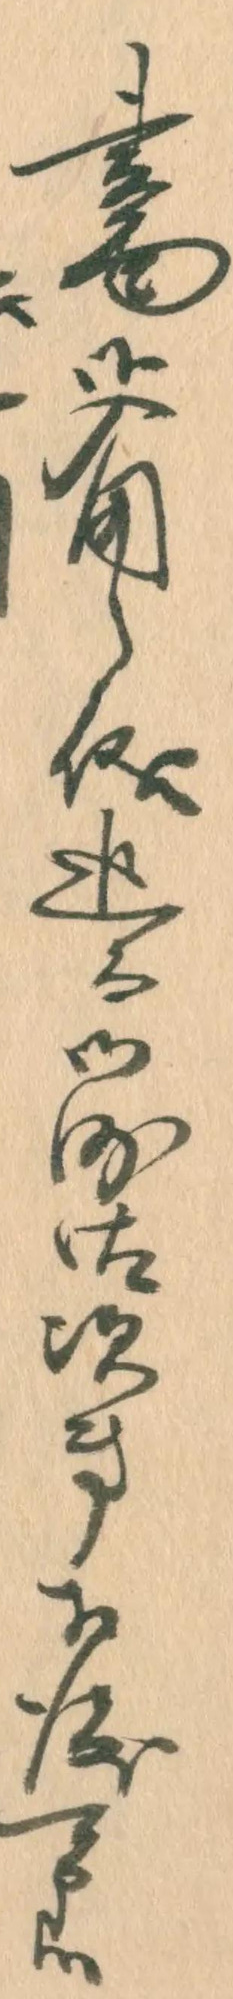│書面御入用之儀追而御沙汰次第相渡可申候
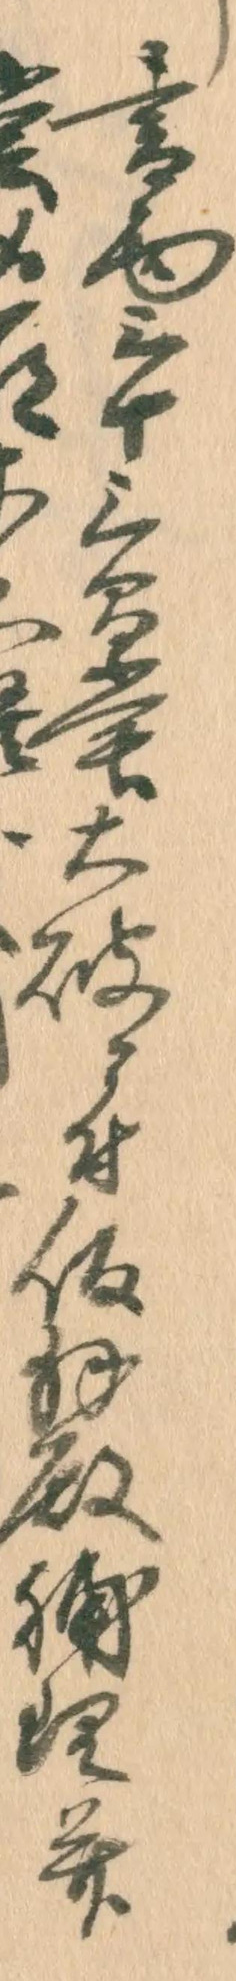│書面三十三間堂大破に付仮拝殿補理幷
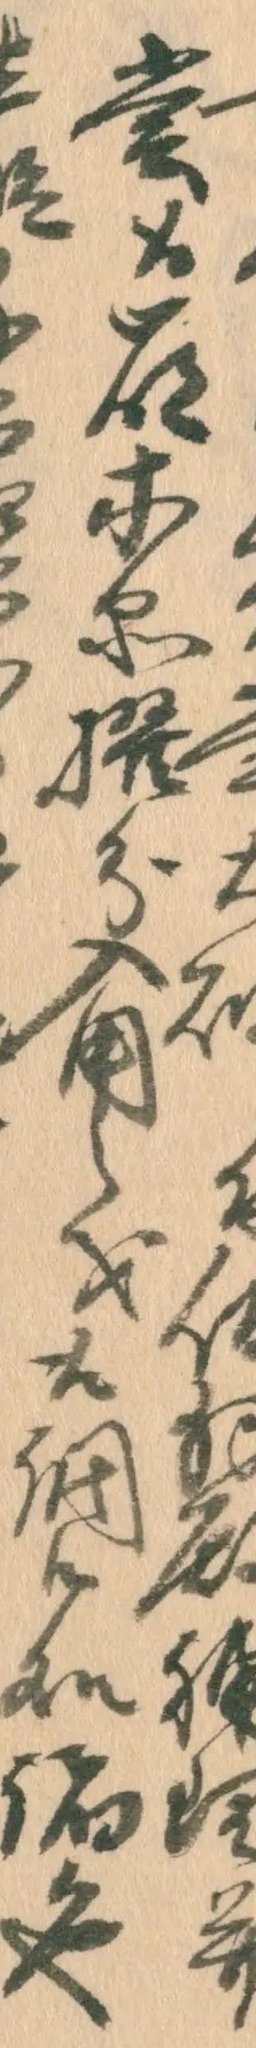│堂取崩木品撰分入用之義取調候処諸色
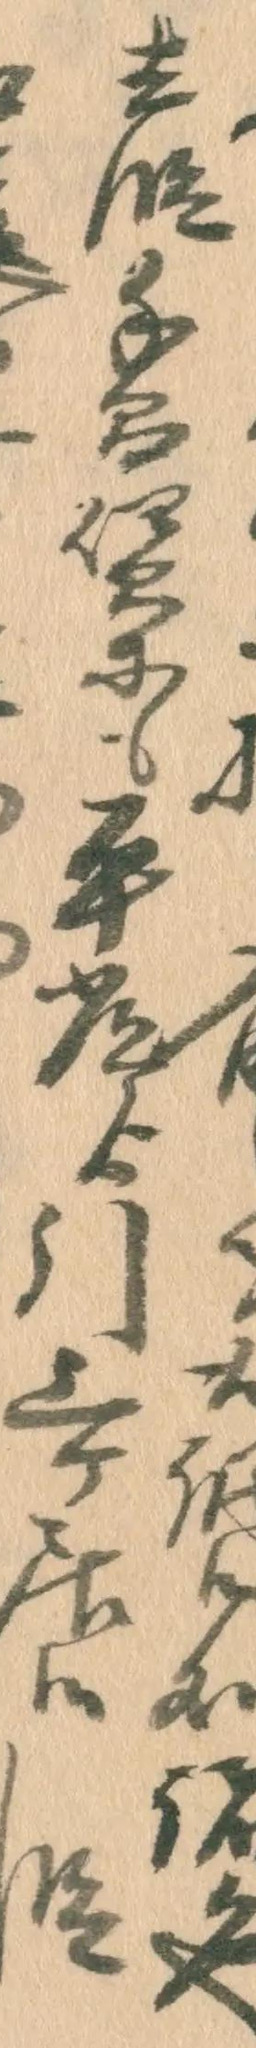│直段手間賃等も平常ゟ引上け居候段
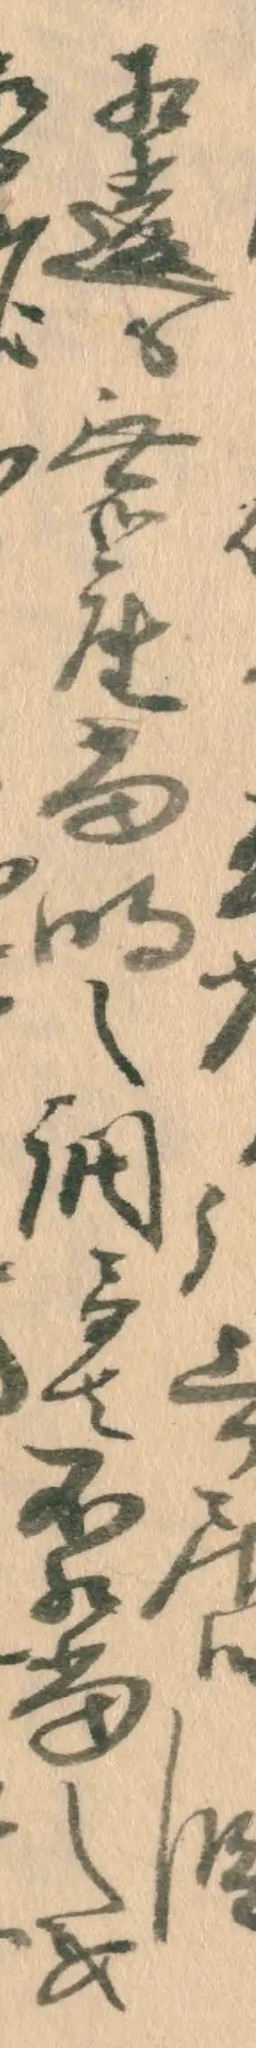│相違も無御座当時之調に而は不相当之義
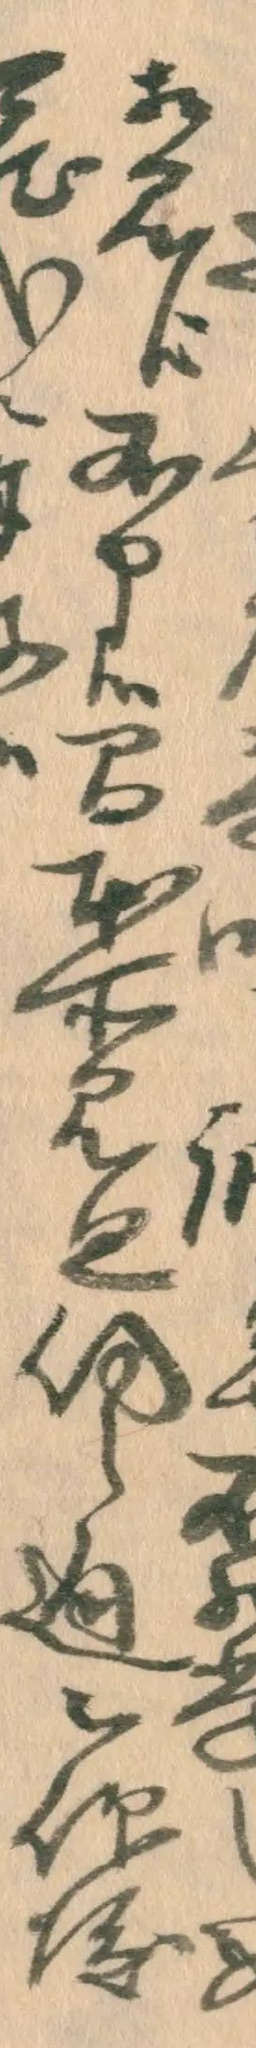│相見え不申候間本所見廻伺之通被仰渡
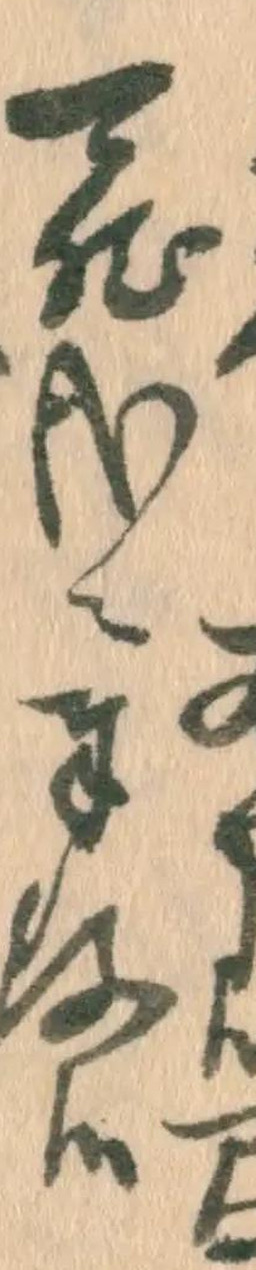│可然哉に奉存候
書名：三十三間堂. [1]
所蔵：国立国会図書館 National Diet Library, JAPAN
